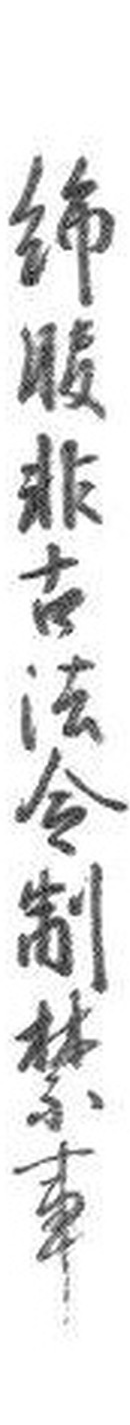飾服非古法令制禁事
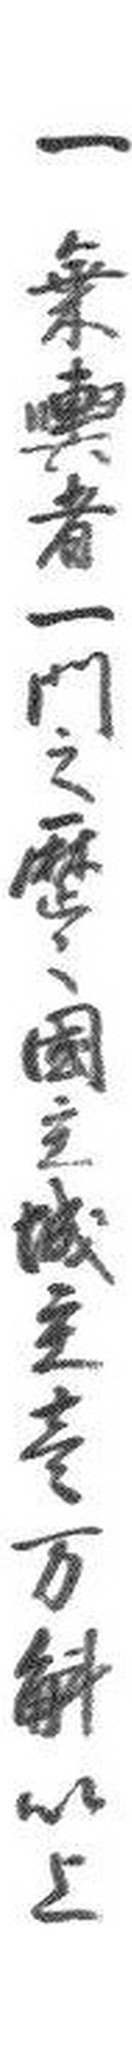一乗輿者一門之歴々国主城主壱万斛以上
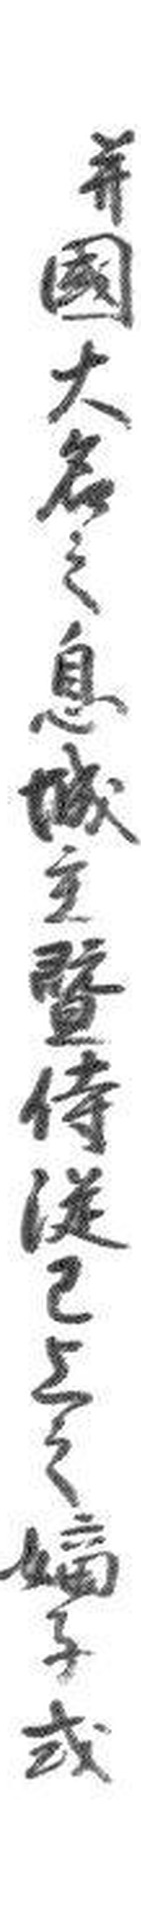并国大名之息城主曁侍従已上之嫡子或
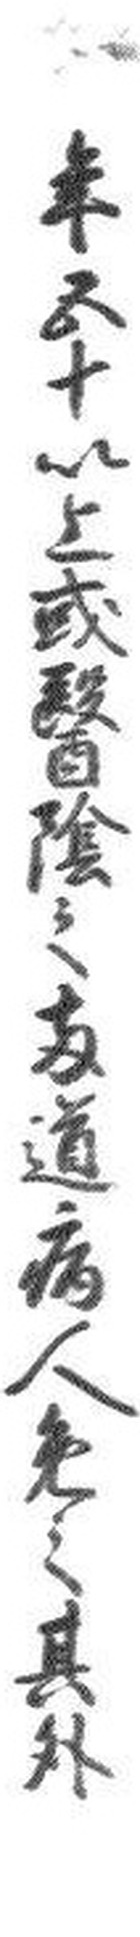年五十以上或医陰之両道病人免之其外
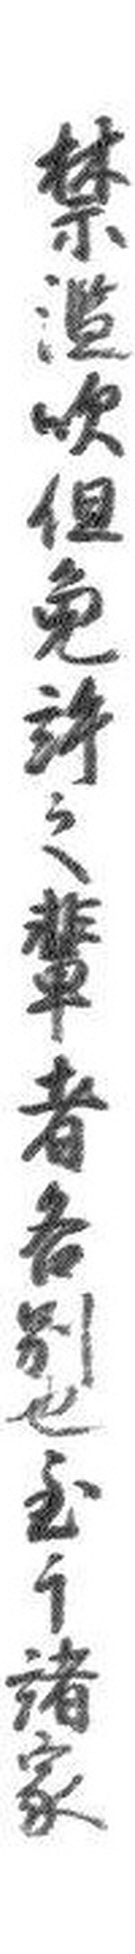禁濫吹但免許之輩者各別也至于諸家
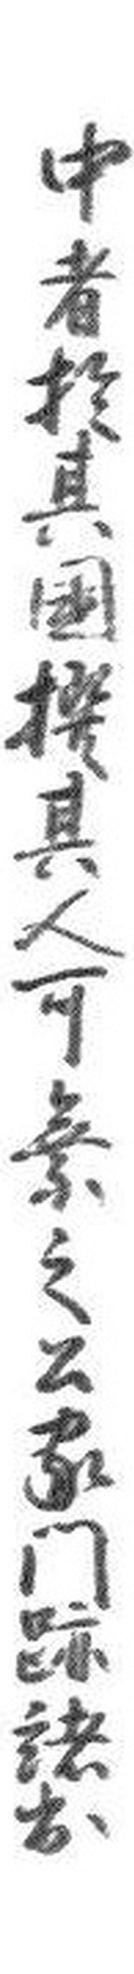中者於其国撰其人可乗之公家門跡諸出
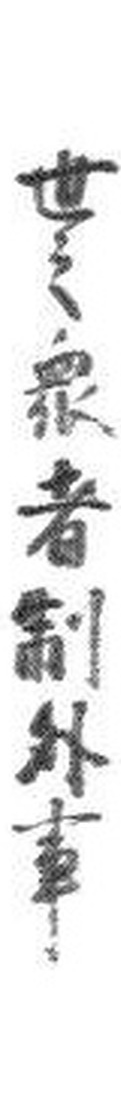世之衆者制外事
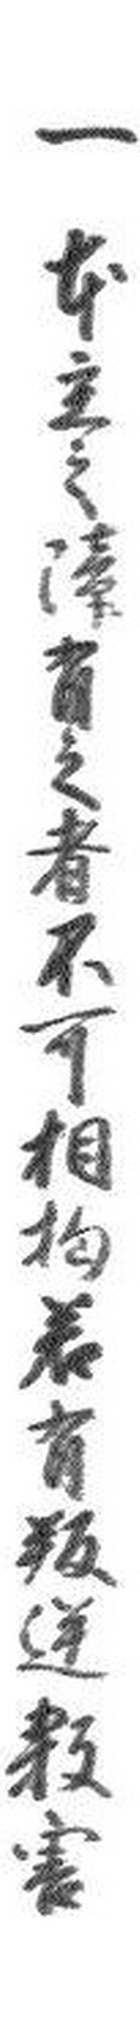一本主之障有之者不可相抱若有叛逆殺害
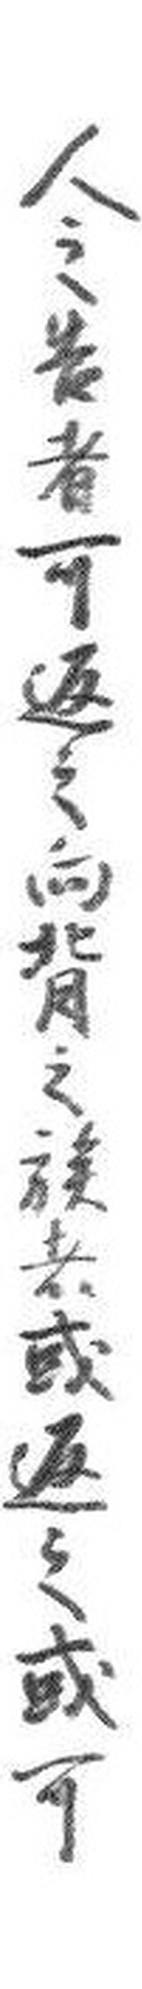人之告者可返之向背之族者或返之或可
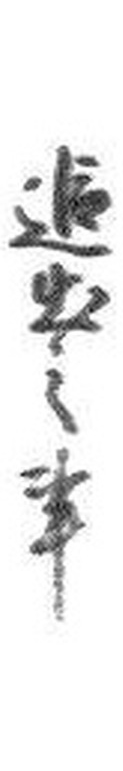追出之事

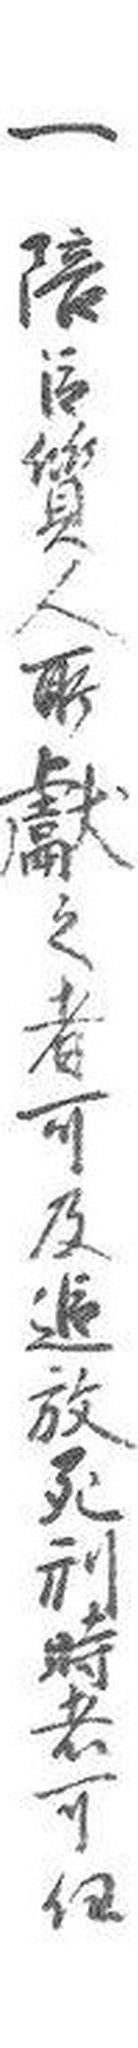一陪臣質人所献之者可及追放死刑時者可任
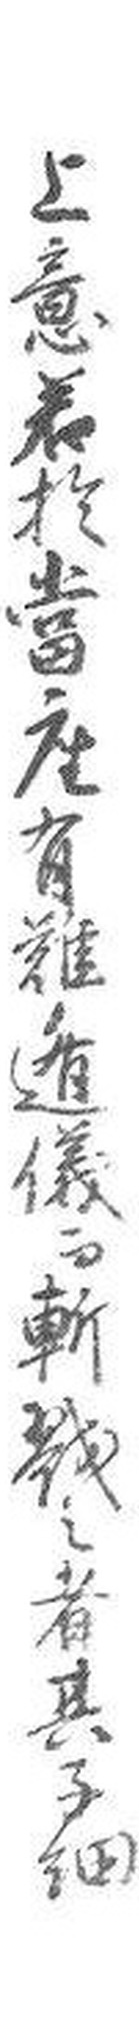上意若於当座有難遁儀而斬戮之者其子細
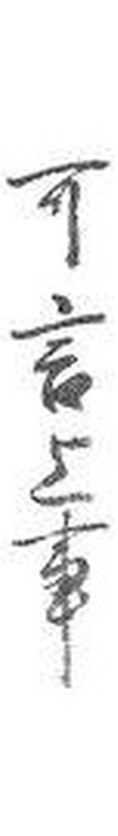可言上事
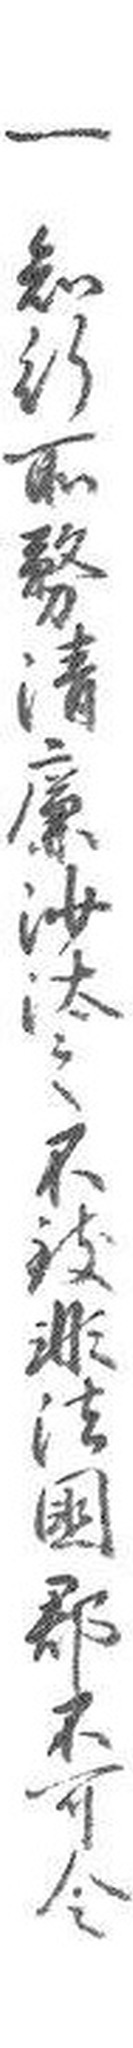一知行所務清廉沙汰之不致非法国郡不可令
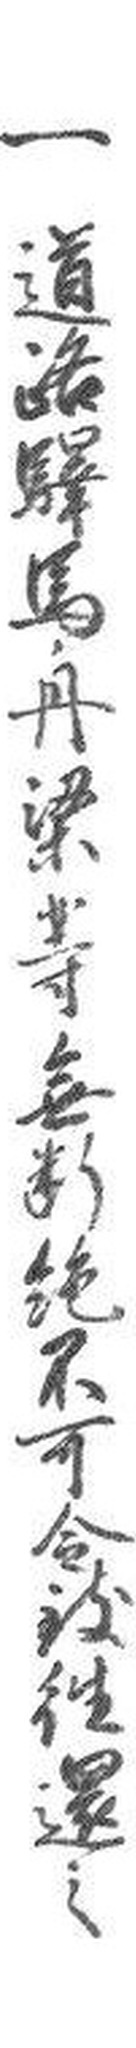一道路駅馬舟梁等無断絶不可令致往還之
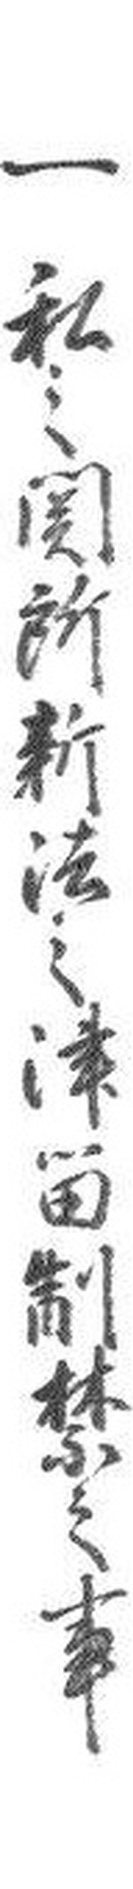一私之関所新法之津留制禁之事
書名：家譜 四 忠昌公 従寛永七年到正保四年
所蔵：福井県文書館 Fukui Prefectural Archives
